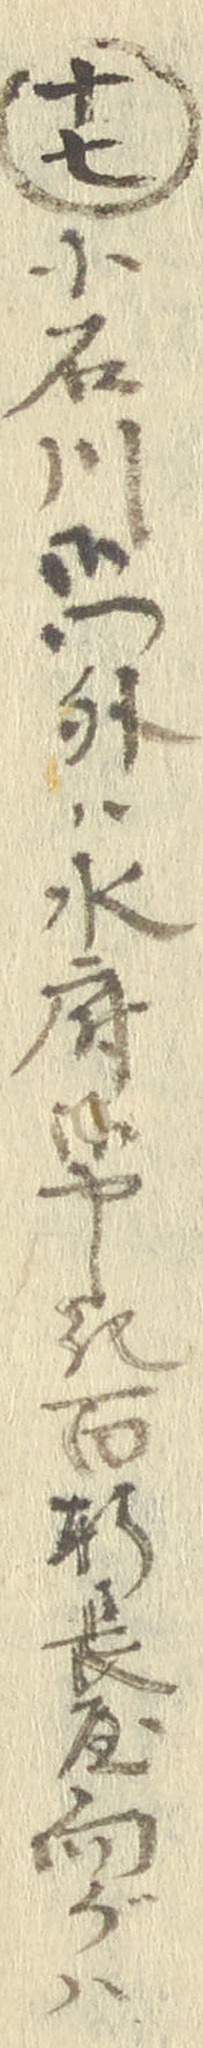十七小石川御門外ハ水府御やき百軒長屋向がハ
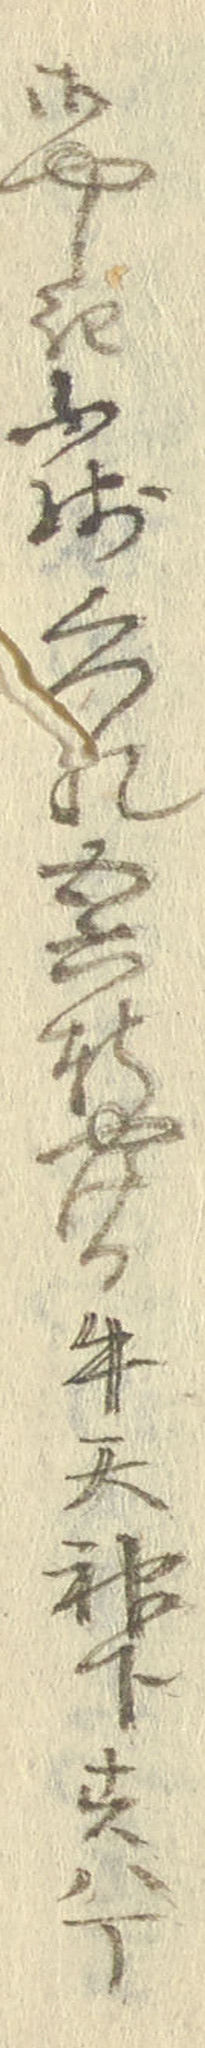御やき不残くつれ五六軒やける牛天神下すハ丁
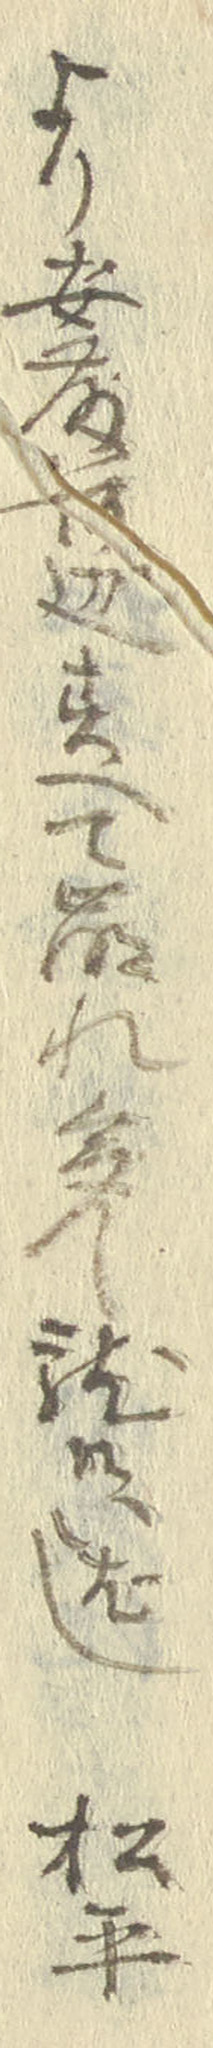より安藤坂辺すへて崩れ多し龍けいばし松平
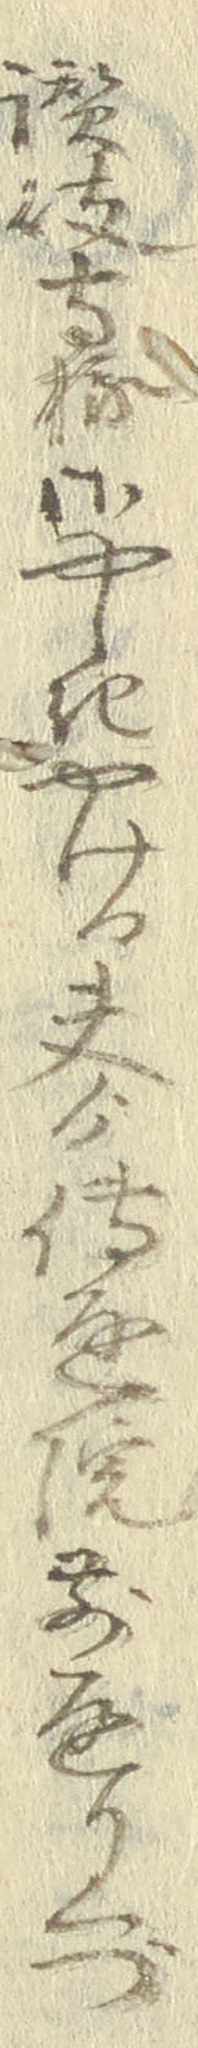讃岐守様御やきやける夫ゟ傳通院前通りくづ
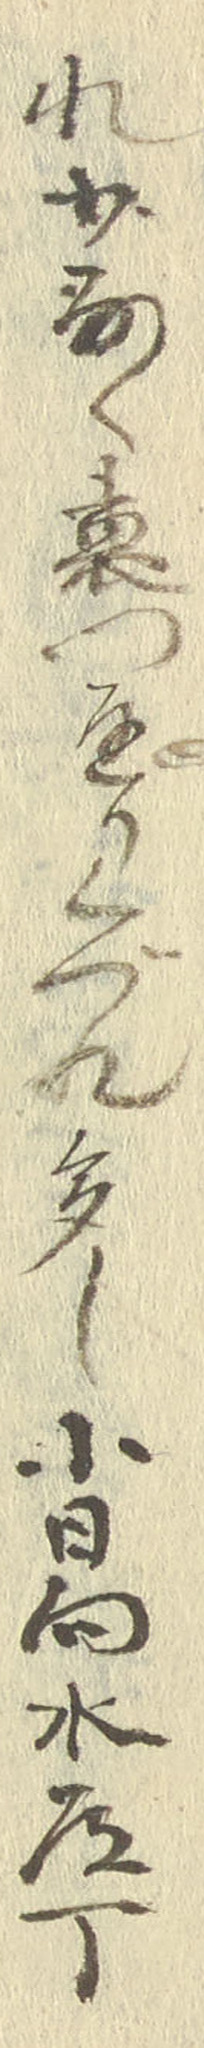れ少なく裏門通りくづれ多し小日向水道丁
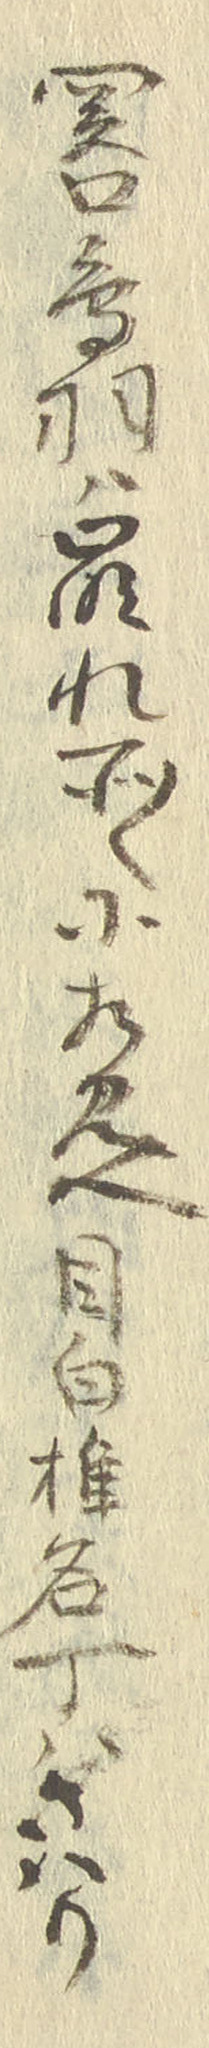関口鳥羽ハ崩れ所〳〵に相見へ見え目白椎名丁ハさハり

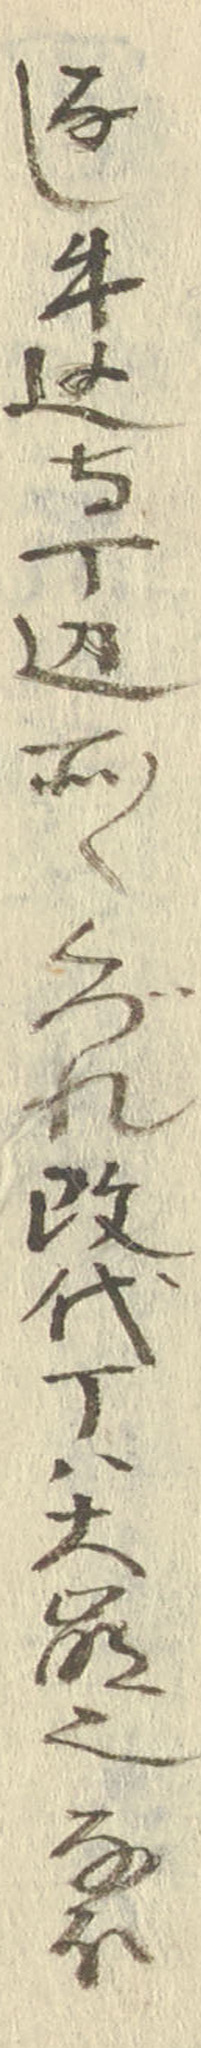なし牛込寺丁辺所〳〵くづれ改代丁ハ大崩也なほ
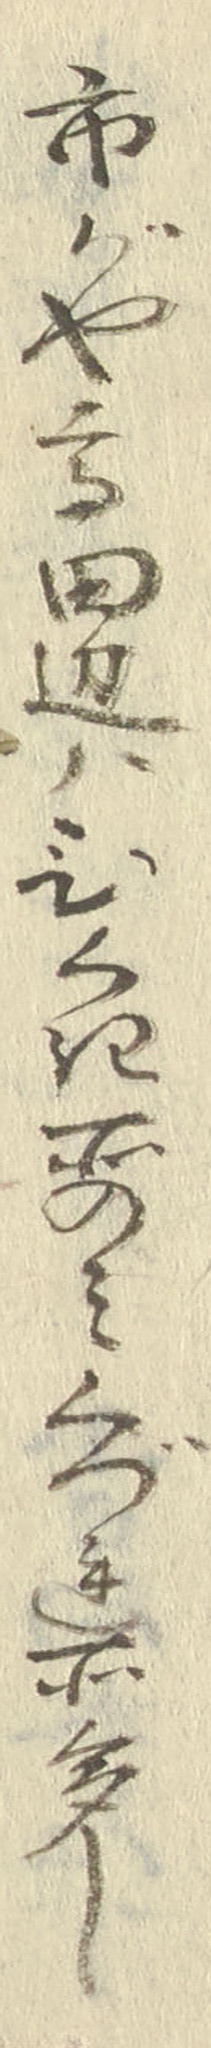市がや高田辺ハひくき所のミくづれ所多し
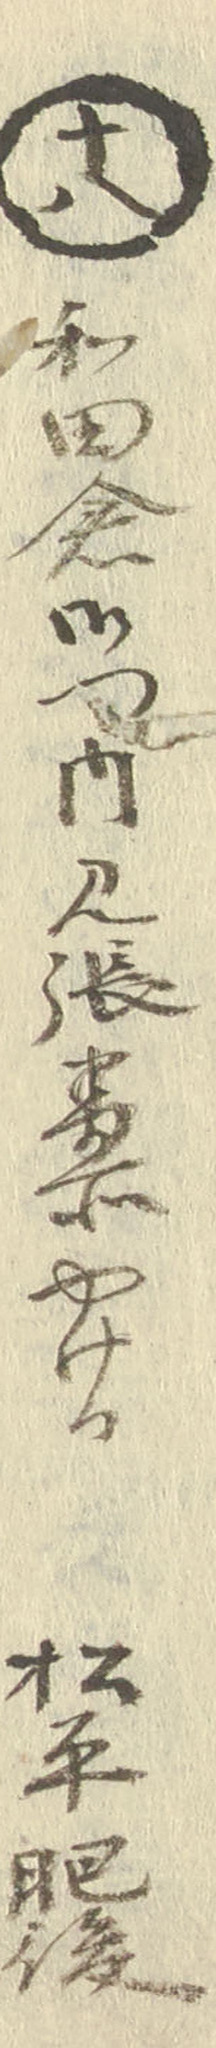十八和田倉御門見張番所やける松平肥後
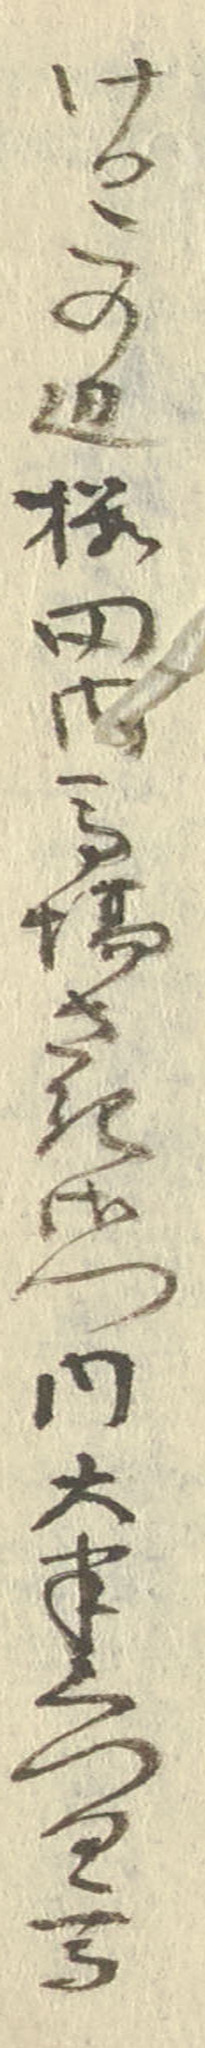この辺桜田内馬場さき御門内大半くつるゝ馬
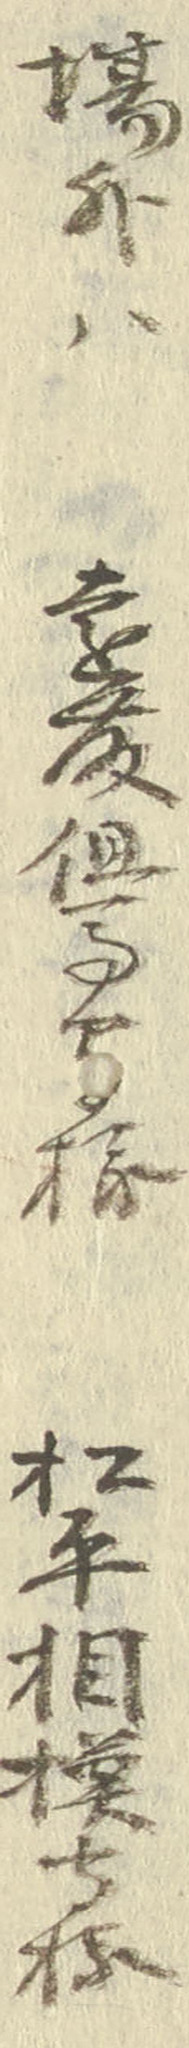場外ハ遠藤但馬守様松平相模守様
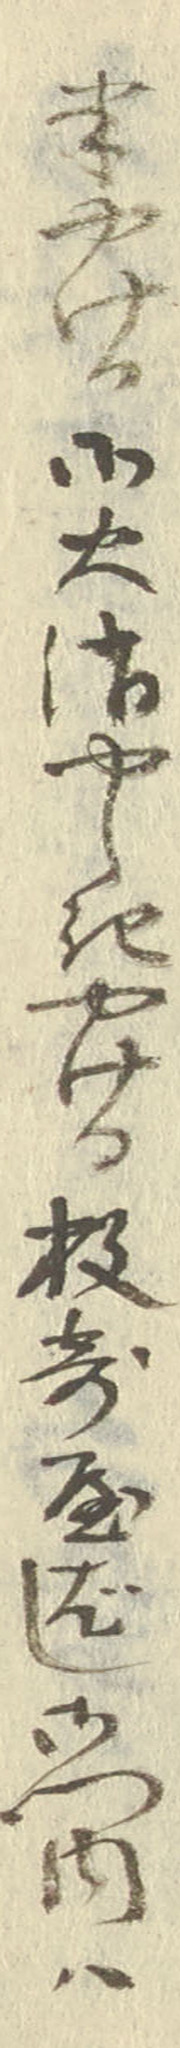半やける御火消やきやける数寄屋ばし御門内ハ
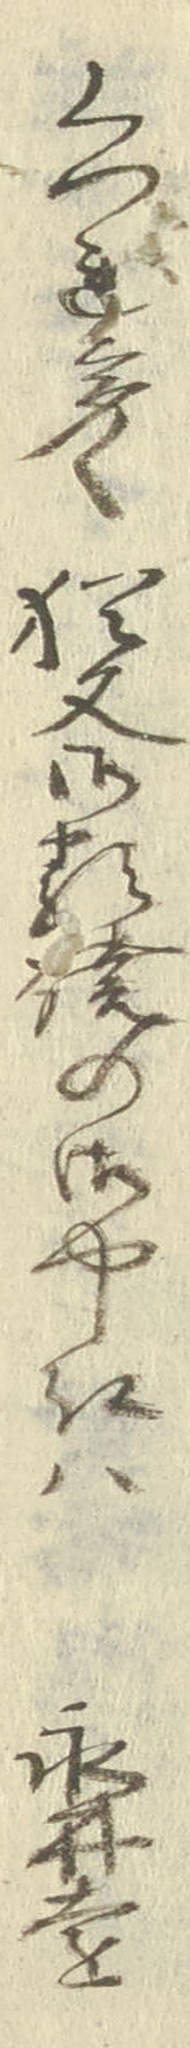くつれ多く猶又御類焼の御やきハ永井遠
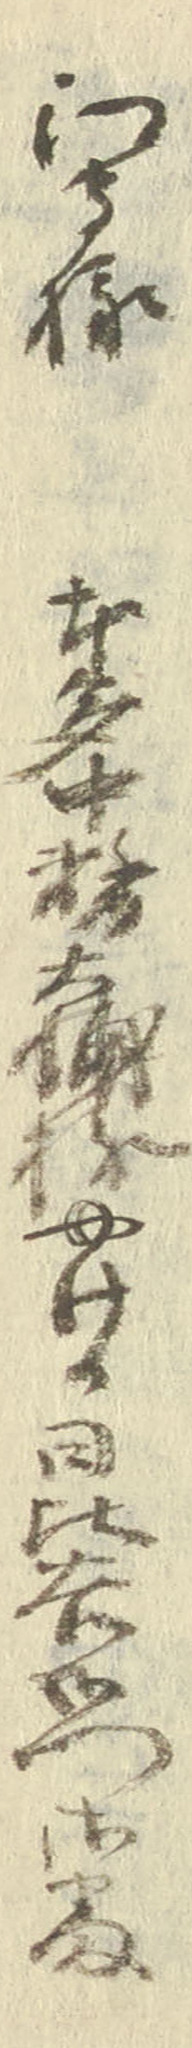江守様本多中務大輔様やける日比谷御番
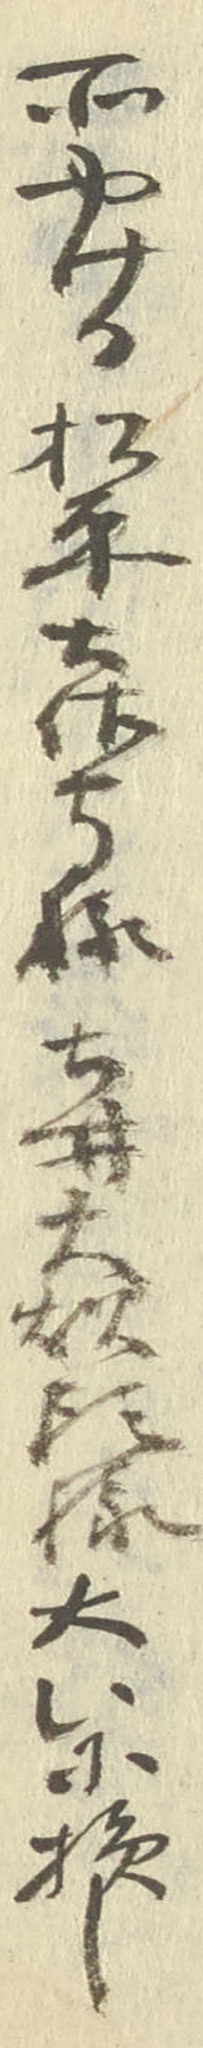所やける松平土佐守様土井大炊頭様大いに損し
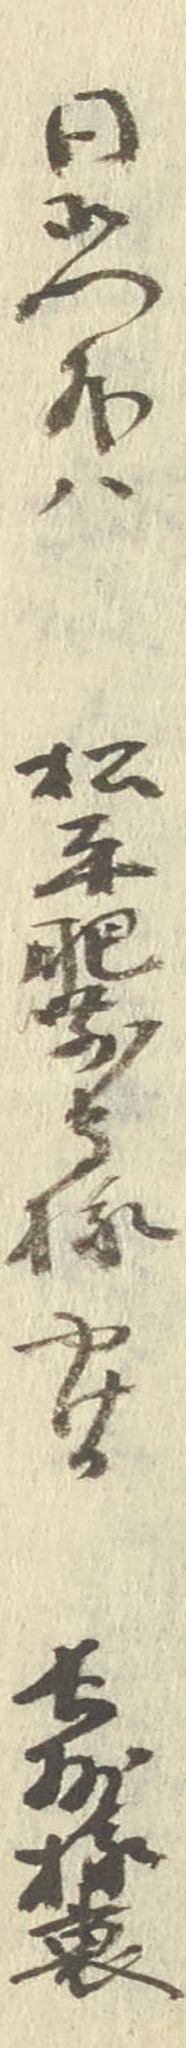同御門外ハ松平肥前守様やける長州様裏
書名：御府内御屋敷方市中共地震類焼場所明細書之冩兼街道筋近郷聞書
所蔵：東京大学総合図書館 General Library in the University of Tokyo, JAPAN
